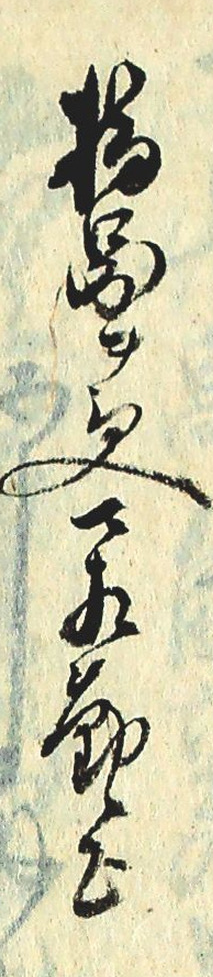指図を受可相勤候以上
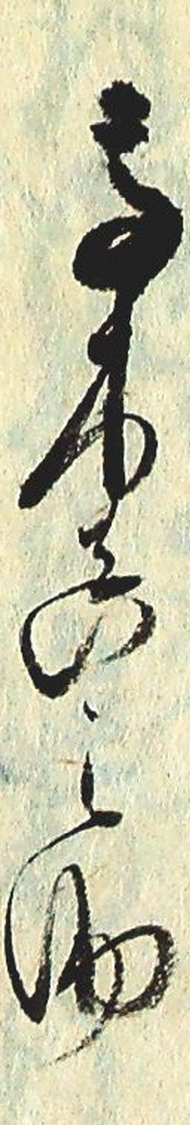高木真之助
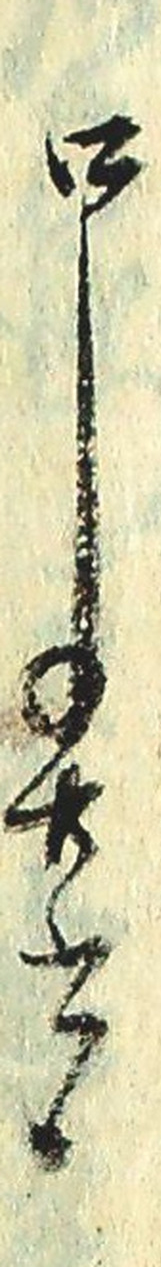四月廿六日
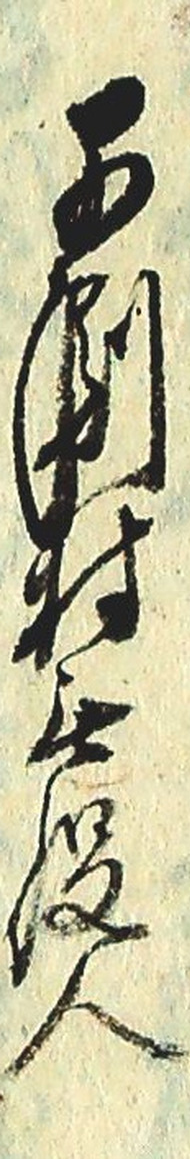早淵村無役人
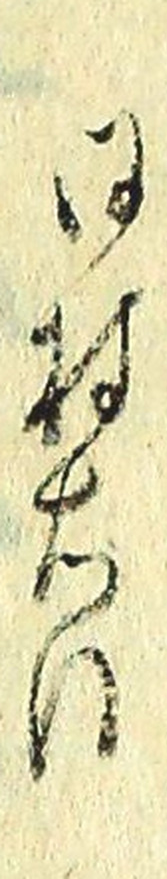同村右同
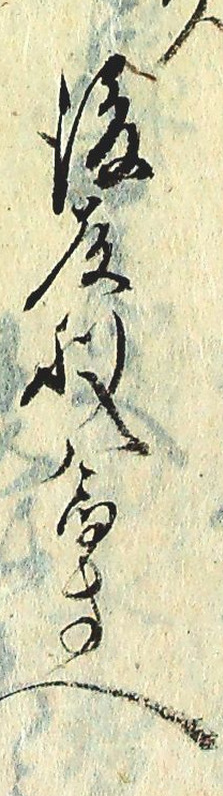後藤利八郎方へ
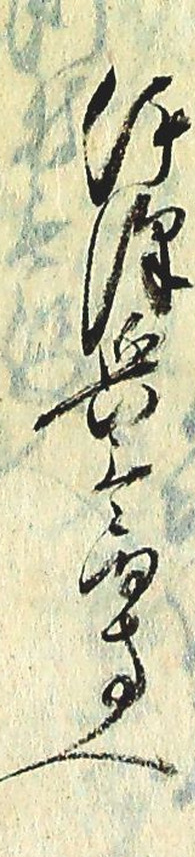伊沢与三郎方へ
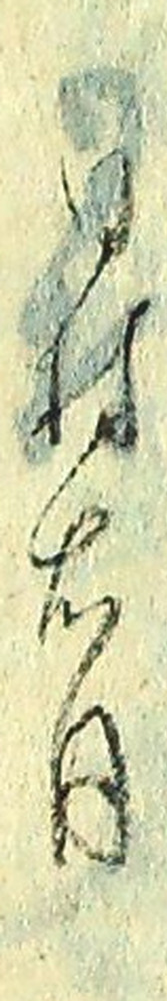同村右同
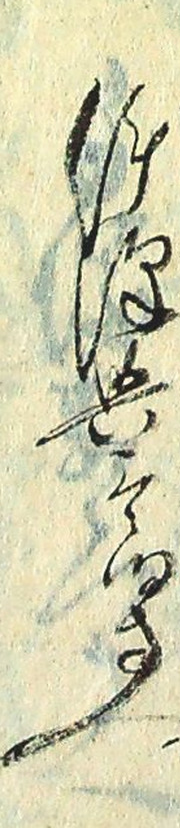伊沢与三郎方へ
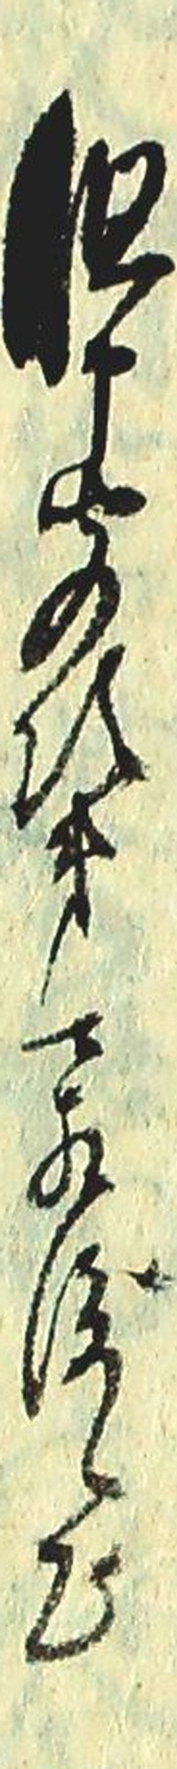但申聞次第可相渡候以上
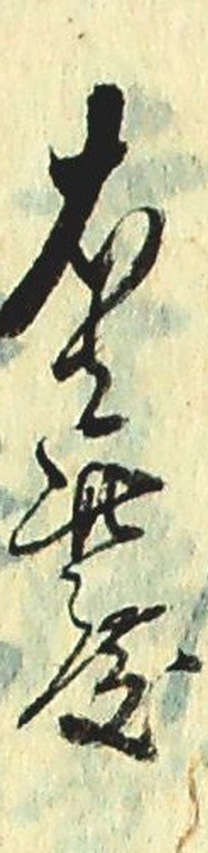右は此度
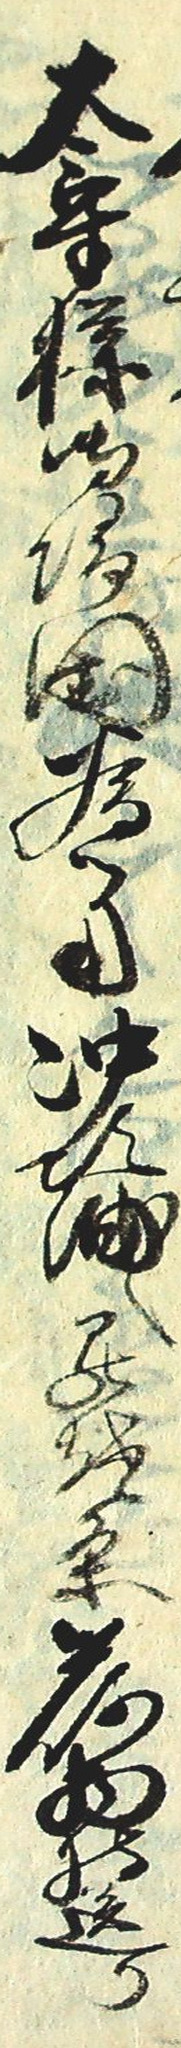太守様御帰国為御用沖須浦へ罷越候条荷物持送り
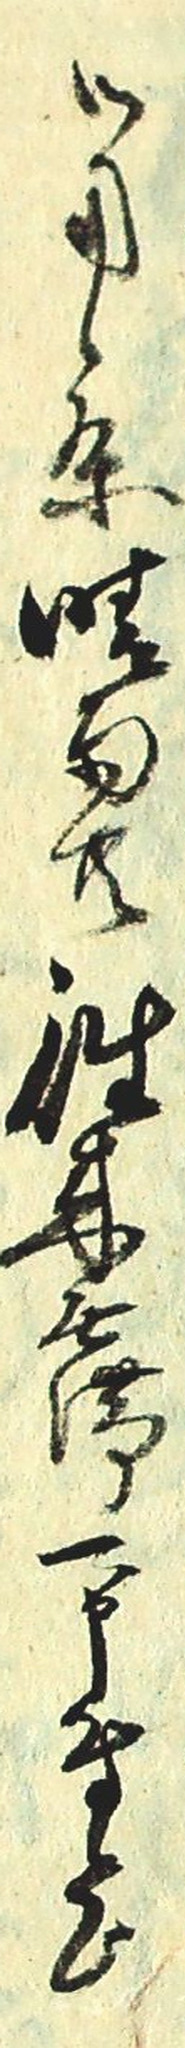御用候条晴雨共往来無滞可申付候以上
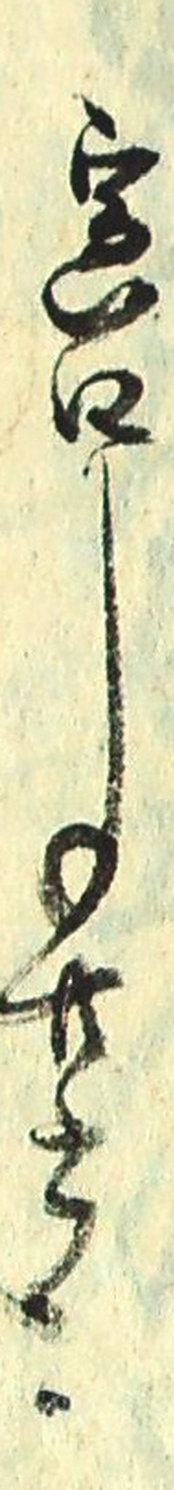寅四月廿六日
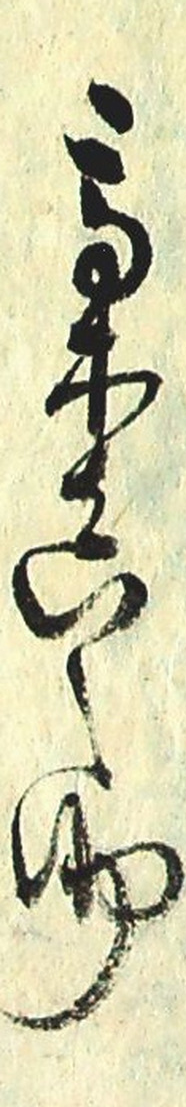高木真之助
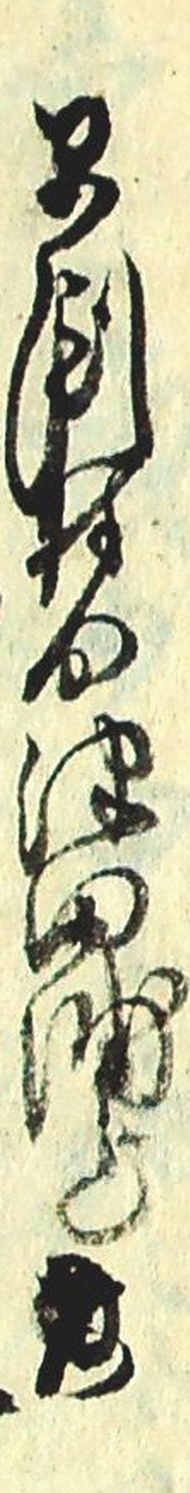早淵村ゟ津田浦迄
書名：諸御願書控(弐番）
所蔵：鳴門教育大学 Naruto University of Education
